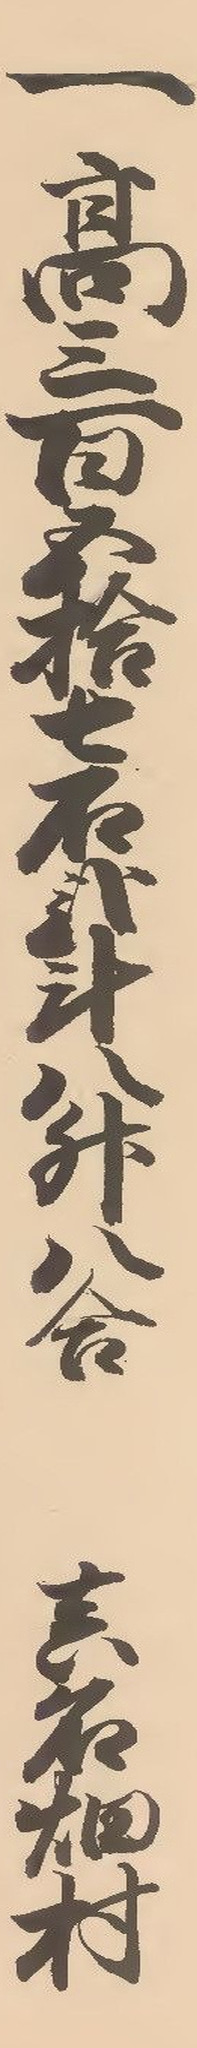一高三百五拾七石弐斗八升八合真名畑村
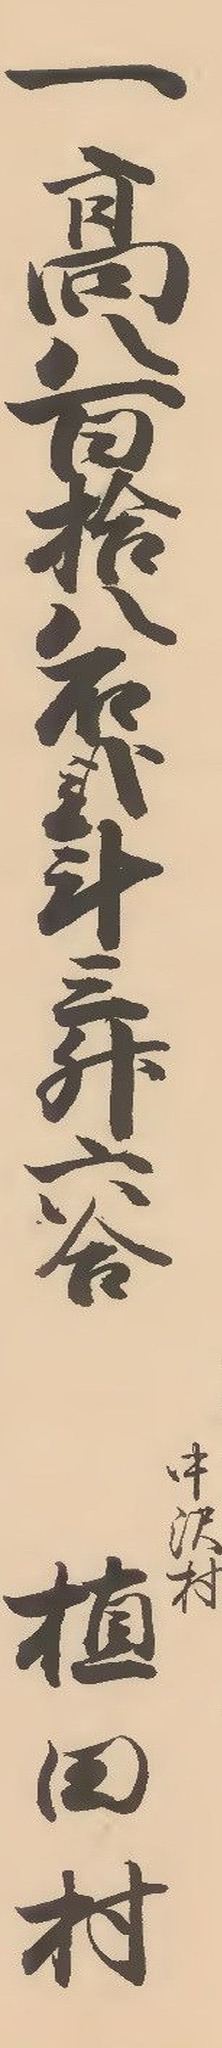一高八百拾八石弐斗三升六合植田村
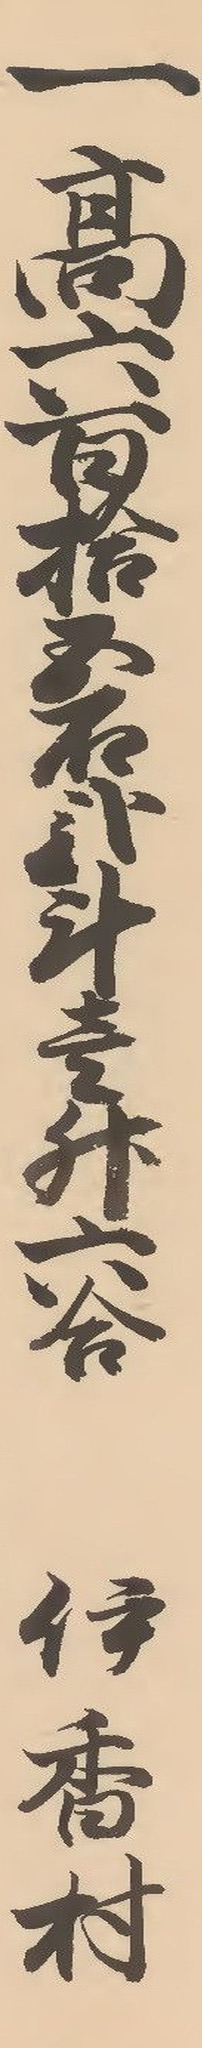一高六百拾五石弐斗壱升六合伊香村
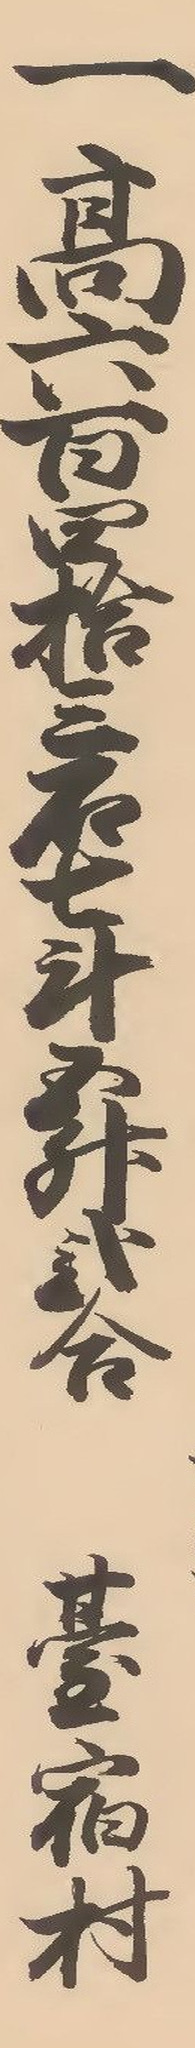一高六百四拾三石七斗五升弐合台宿村

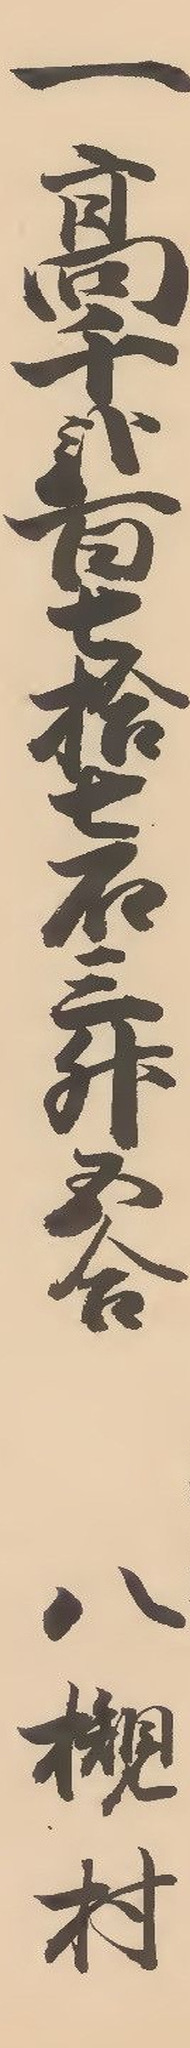一高千弐百七拾七石三升五合八槻村
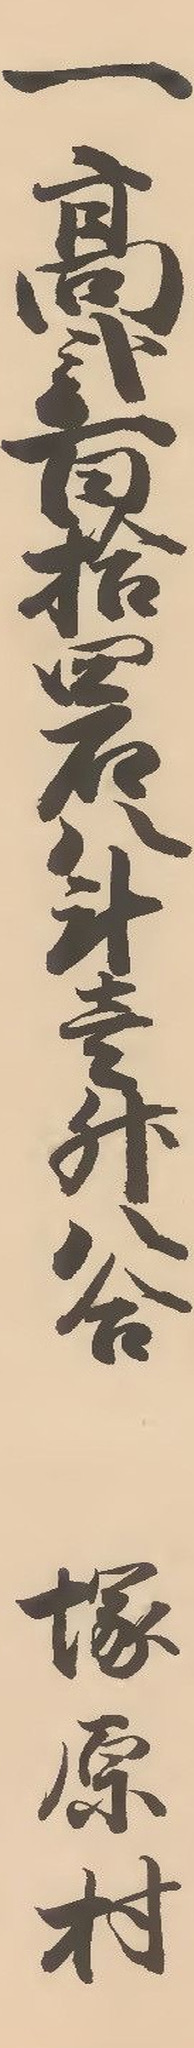一高弐百拾四石八斗壱升八合塚原村
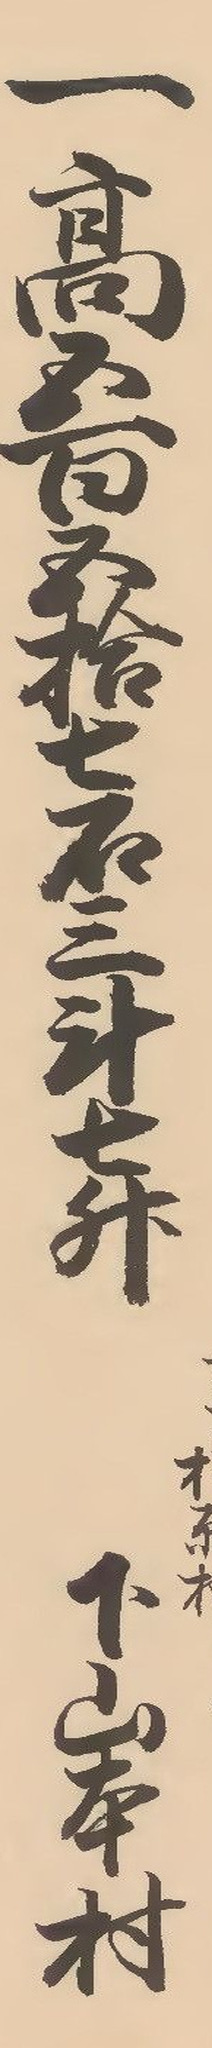一高五百五拾七石三斗七升下山本村
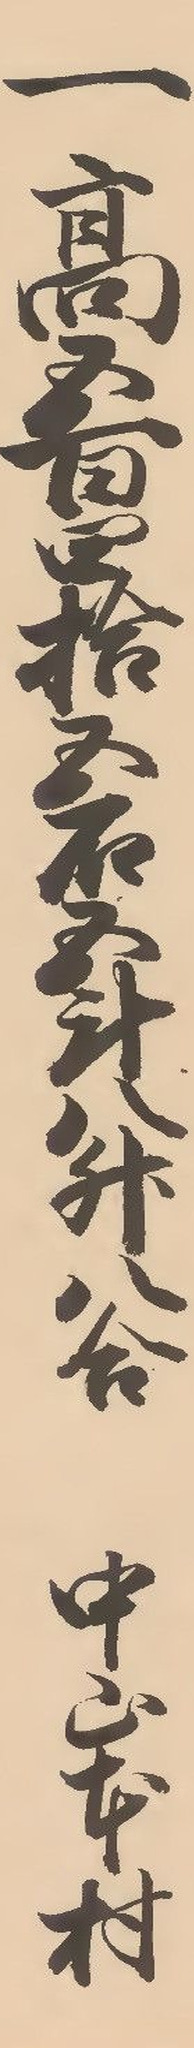一高五百四拾五石五斗八升八合中山本村
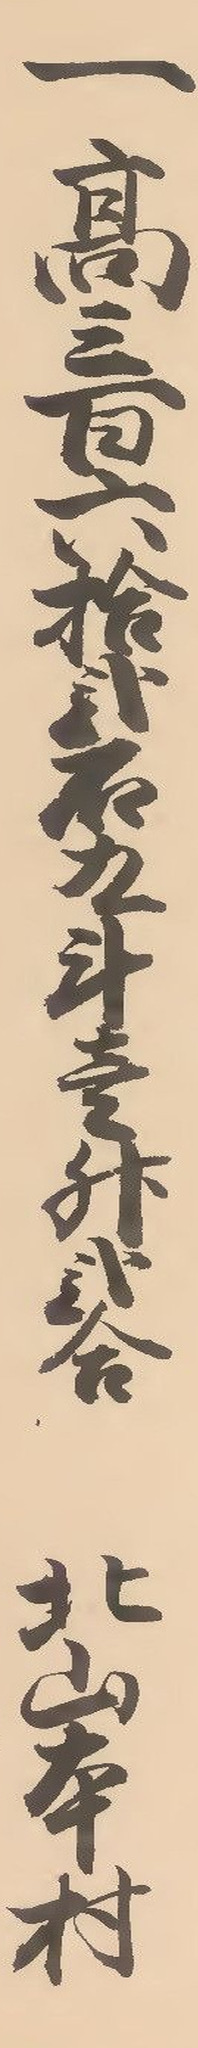一高三百六拾弐石九斗壱升弐合北山本村
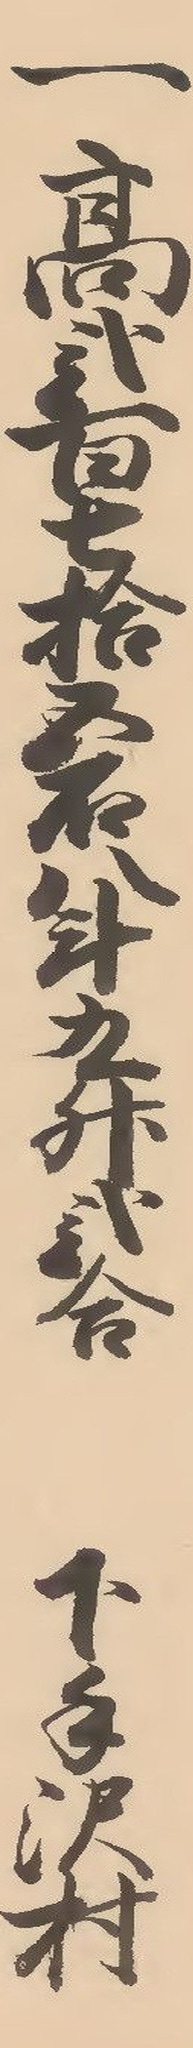一高弐百七拾五石八斗九升弐合下手沢村
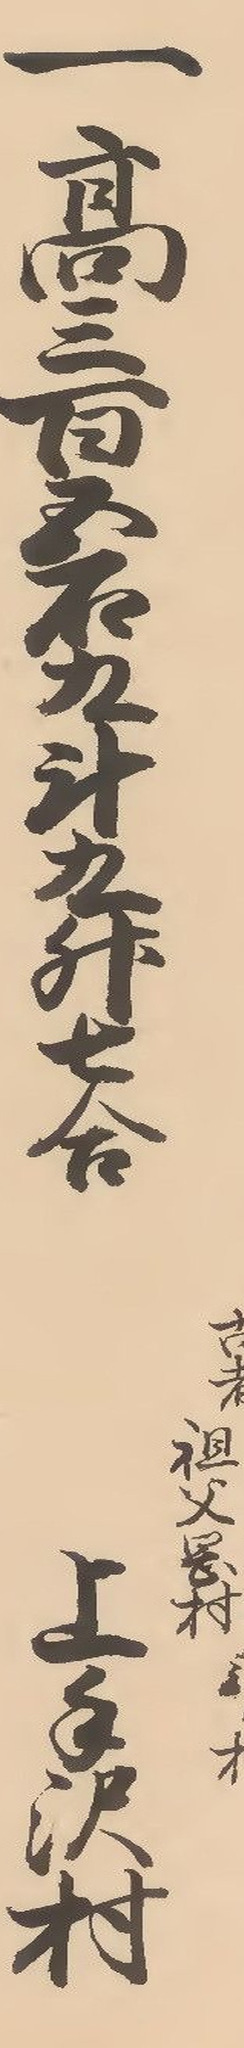一高三百五石九斗九升七合上手沢村
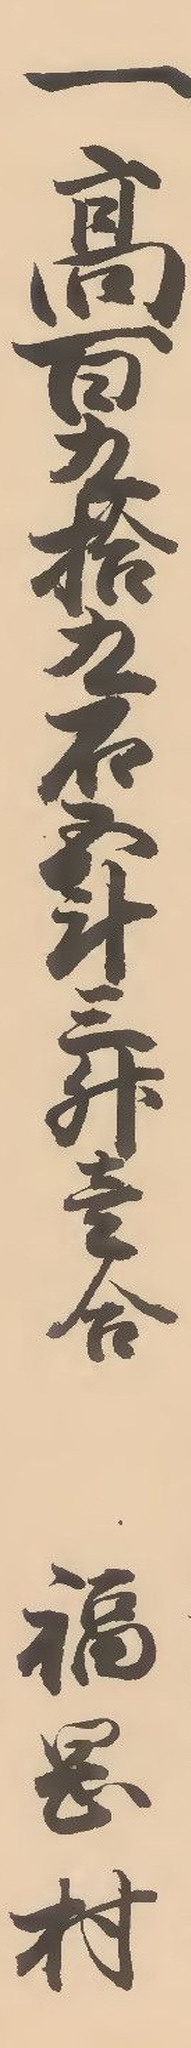一高百九拾九石五斗三升壱合福岡村

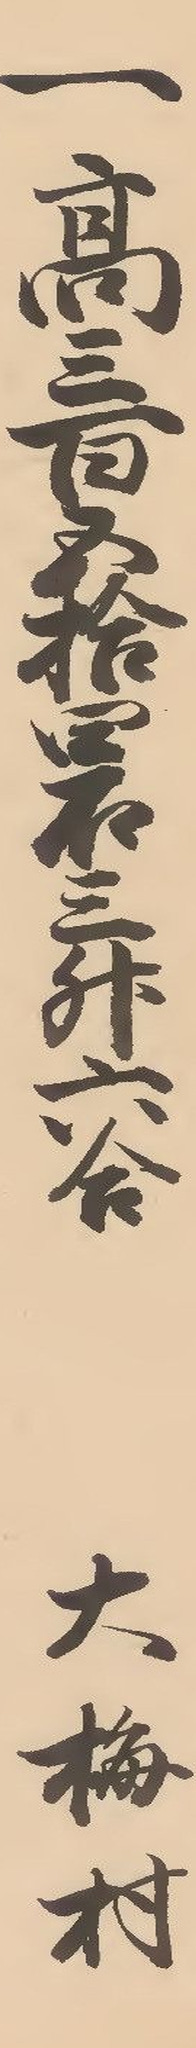一高三百五拾四石三升六合大梅村
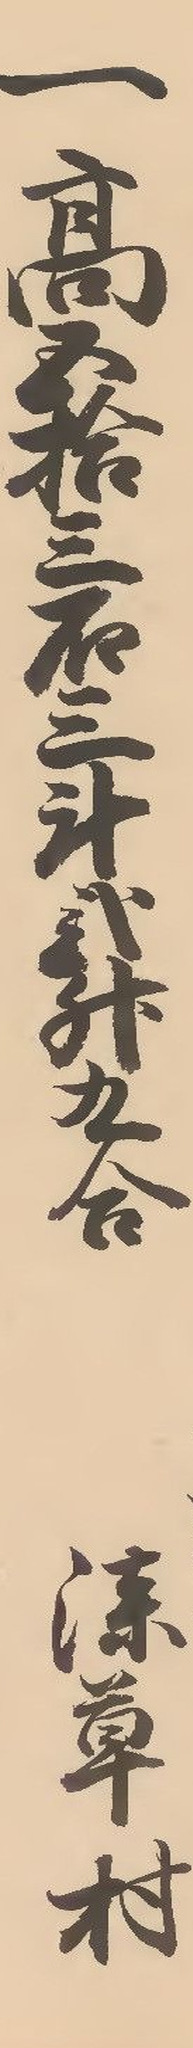一高五拾三石三斗弐升九合漆草村
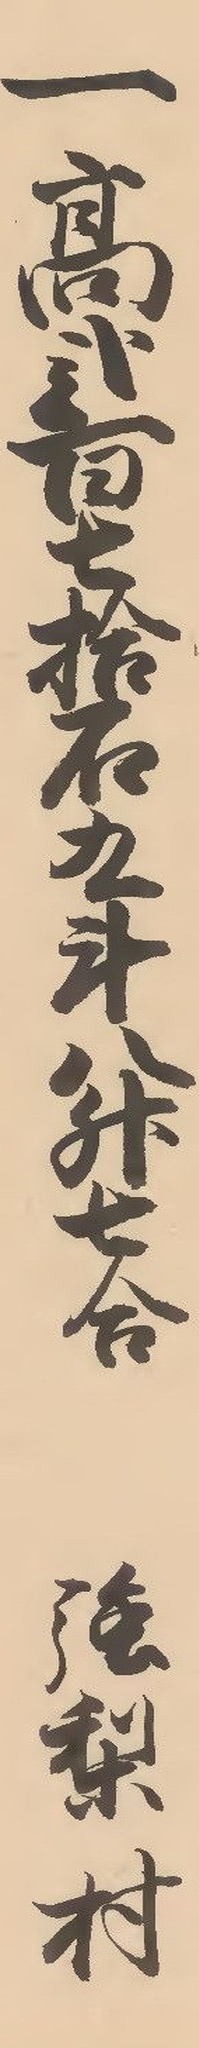一高弐百七拾石九斗八升七合強梨村
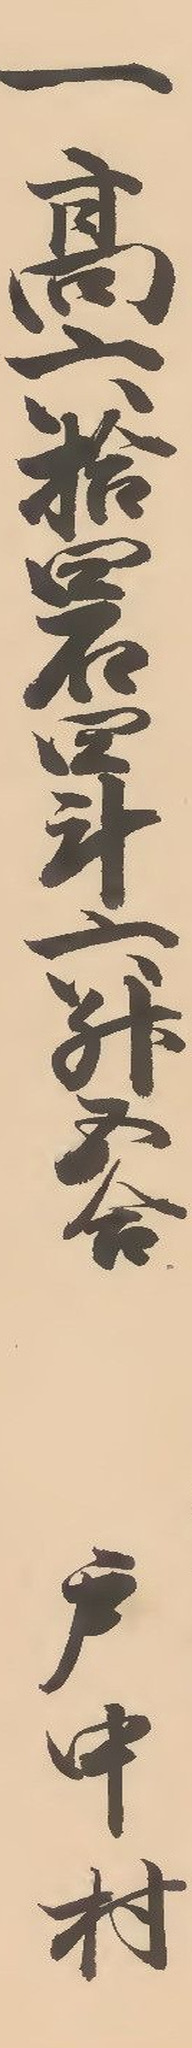一高六拾四石四斗六升五合戸中村
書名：陸奥国郷帳　３
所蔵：国立公文書館 National Archives of Japan
